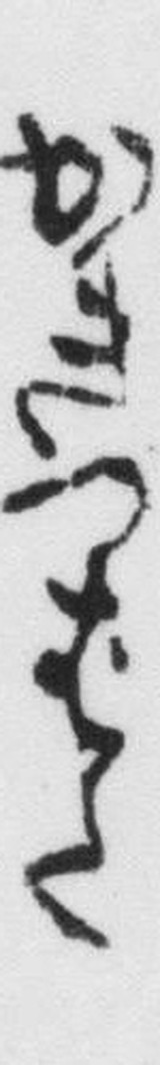かきつはた
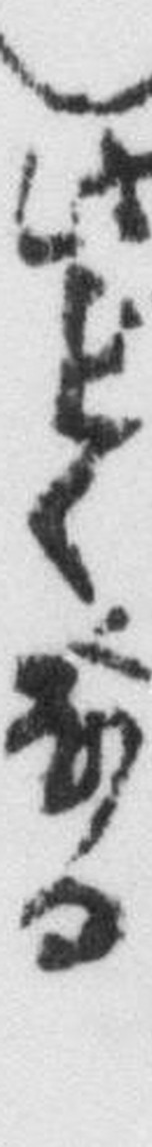かくのごとくなる

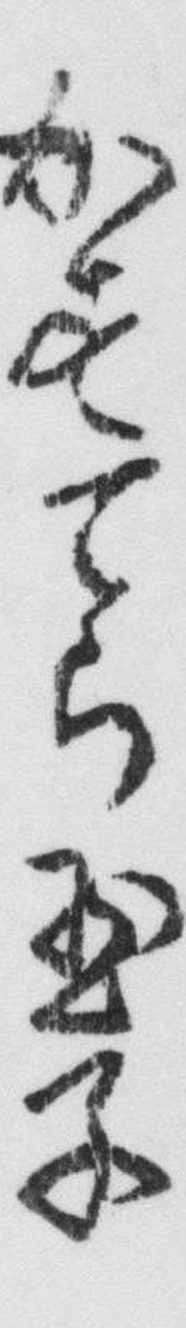かすてら玉子
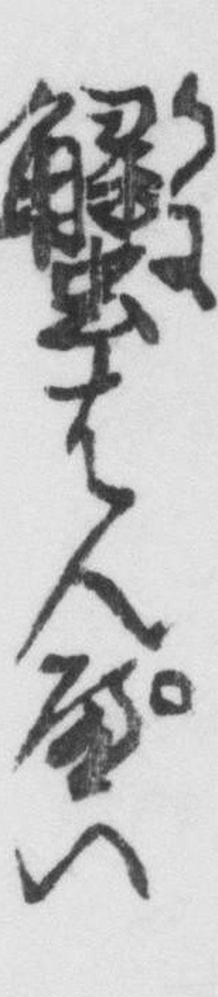蟹はんぺん
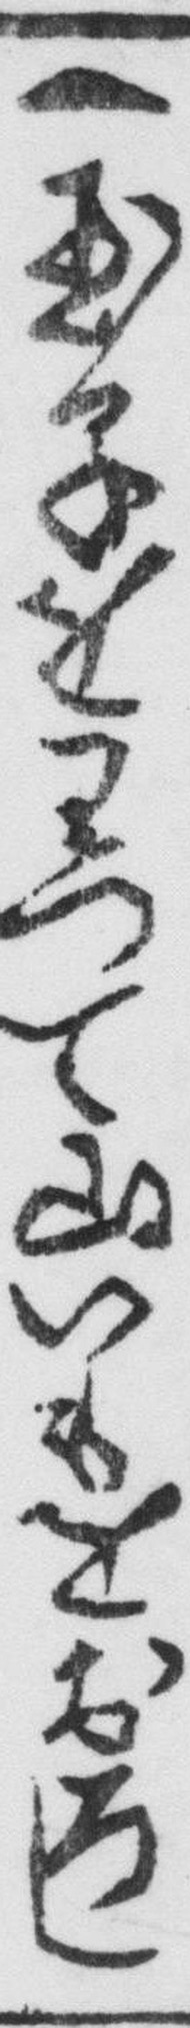▲玉子をわつて山いもをおろし
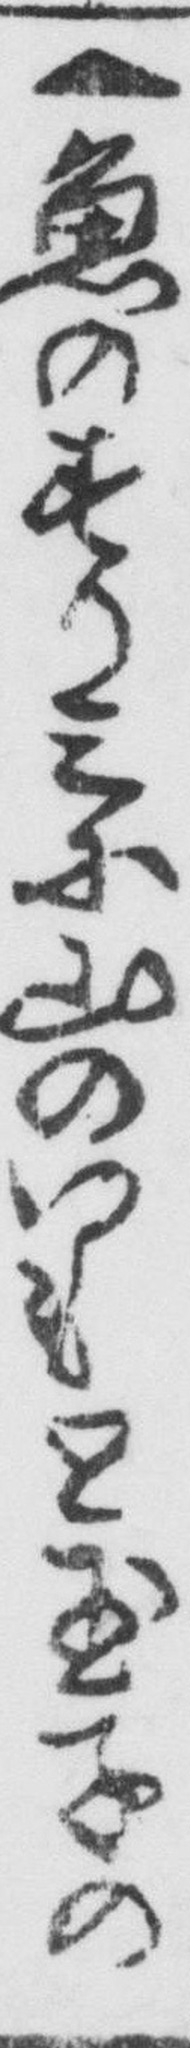▲魚のすりミに山のいもと玉子の
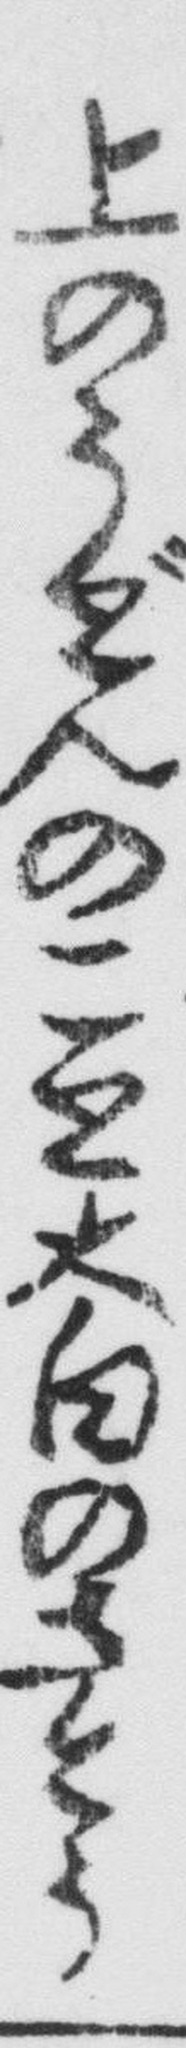上のうどんのこと大白のさとう
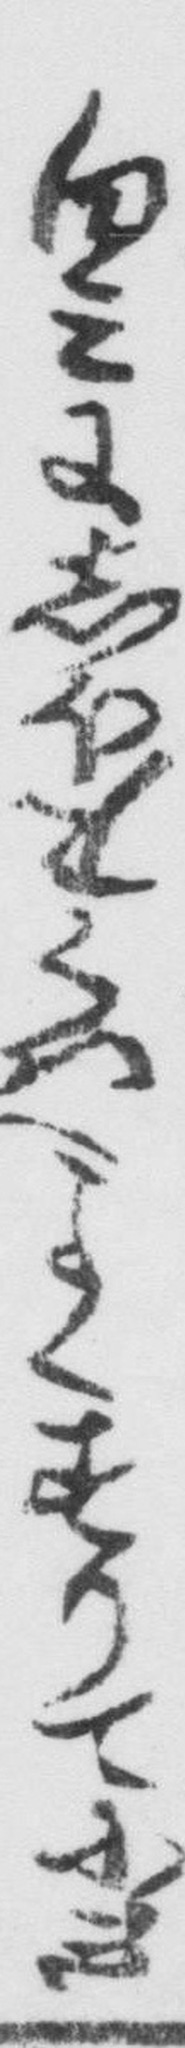白ミにしほをくハへよくすりて
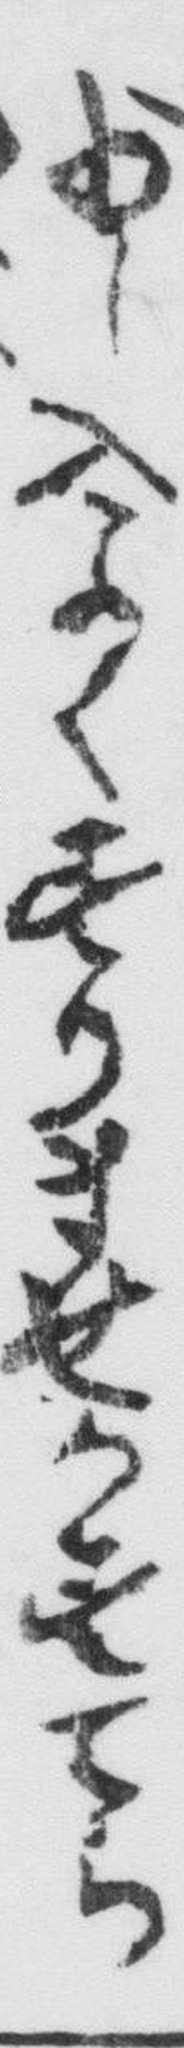少し入よくすりませかすてら
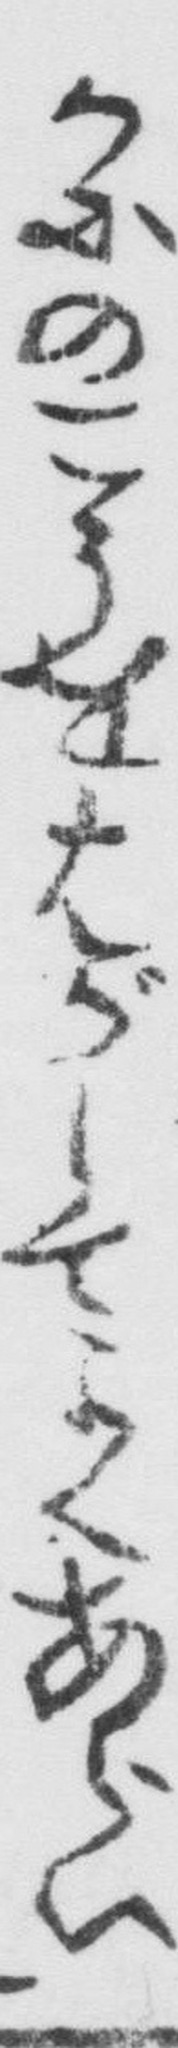かにのこうをはがしてよくあらい
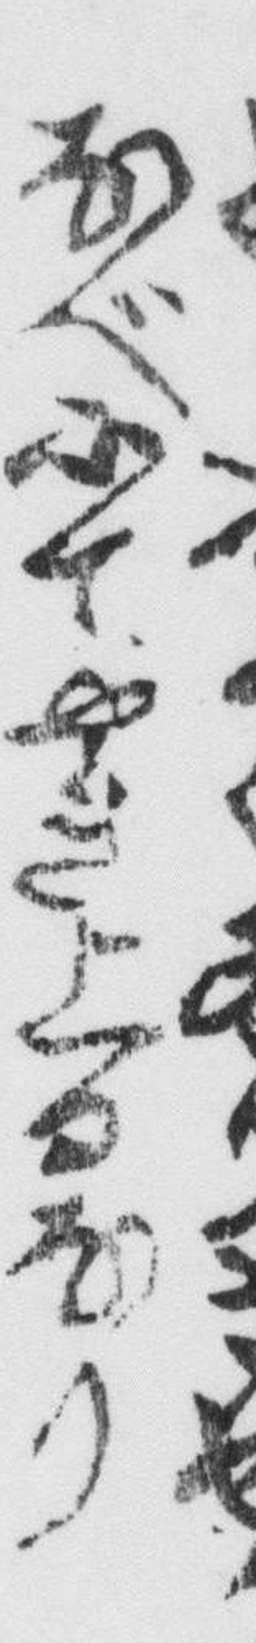なべにてやき上るなり
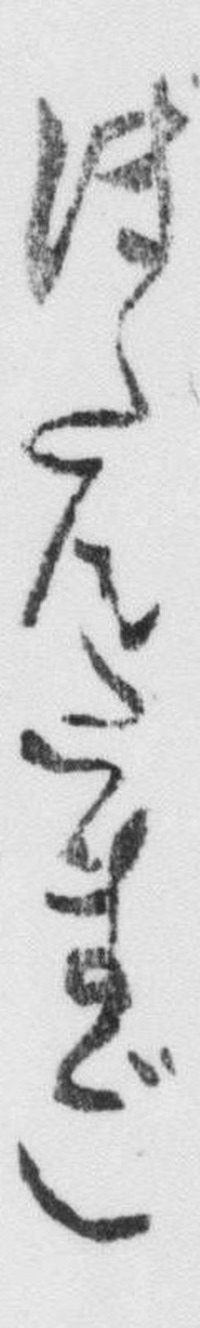ぼたんたまご
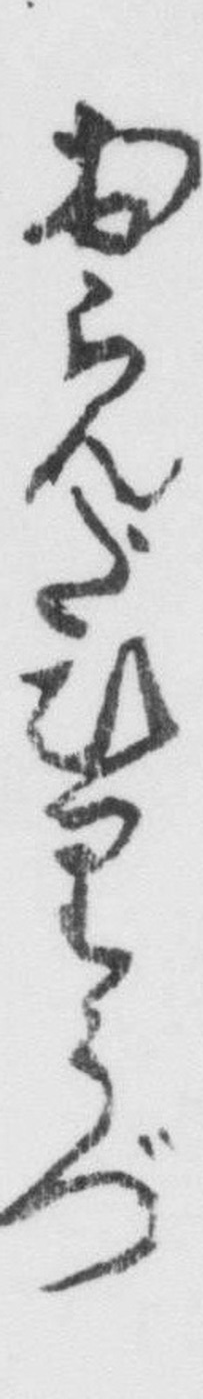おらんだひりうづ
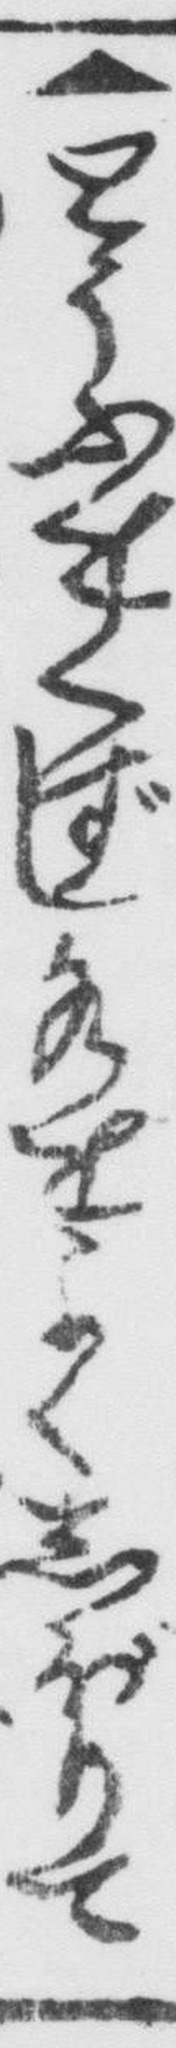▲とうふをくずし水をよくしぼりて
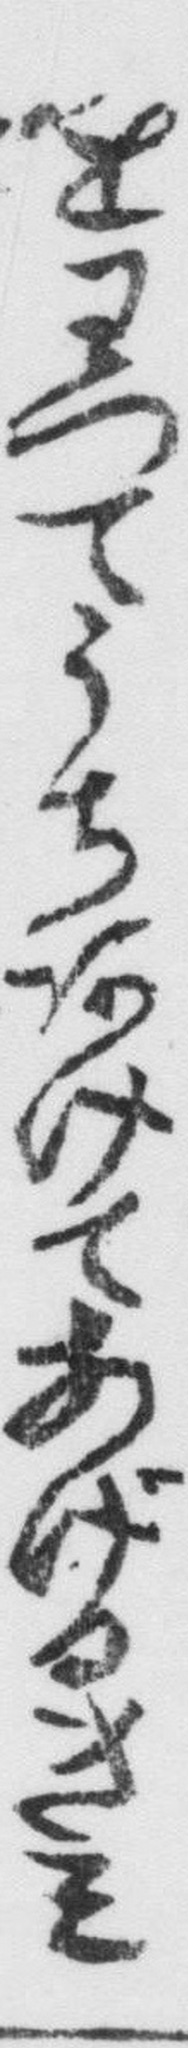をわつてうちあけてあげるきミ
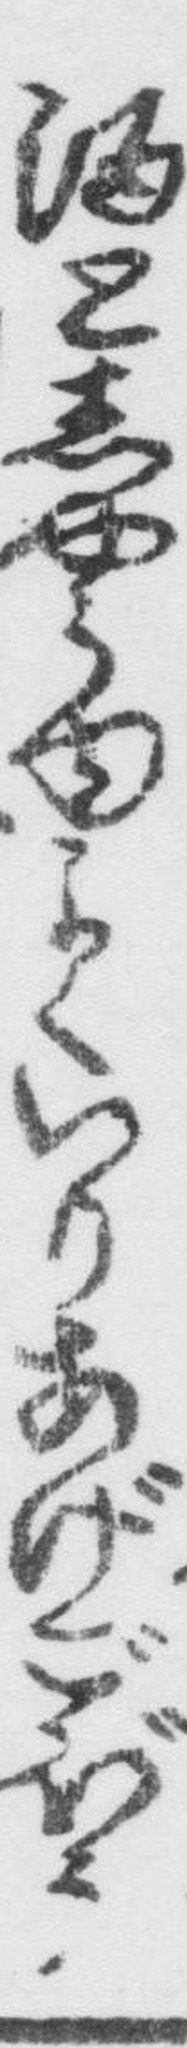酒としやうゆよくいりあげごぼう
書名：即席料理/早指南
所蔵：大阪府立大学学術情報センター 国文学研究資料館
